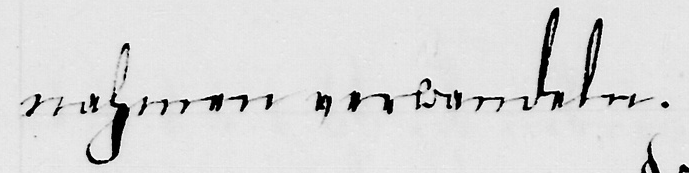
nahmen verwandeln.
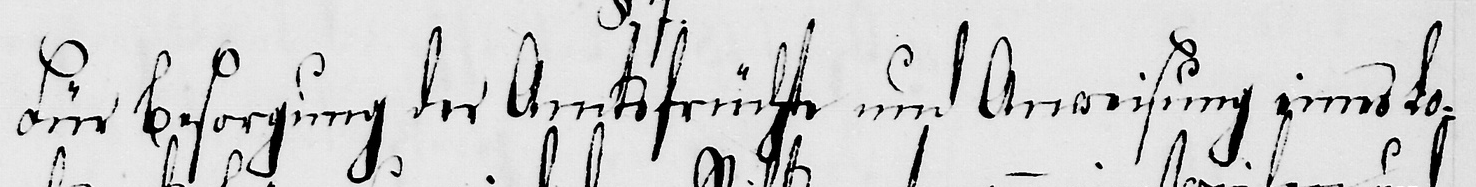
Für Besorgung der Amtsfrüchte und Anweisung eines Lo¬
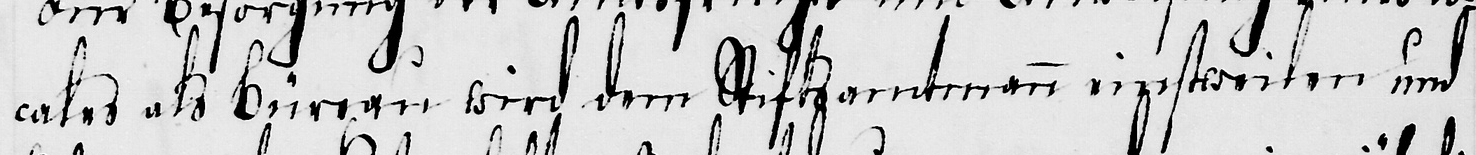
cales als Büreau wird dem Stiftsamtmann einstweilen und
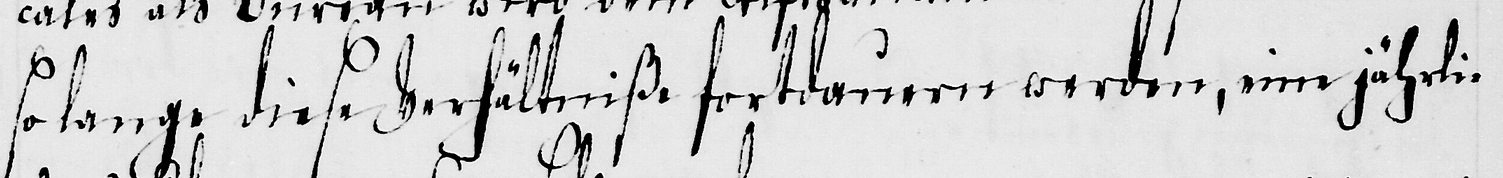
solange die Verhältnisse fortdauern werden, eine jährli¬
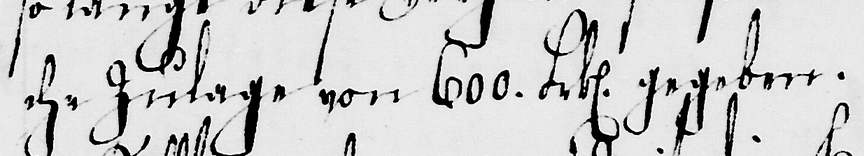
che Zulage von 600. Frk[en]. gegeben.
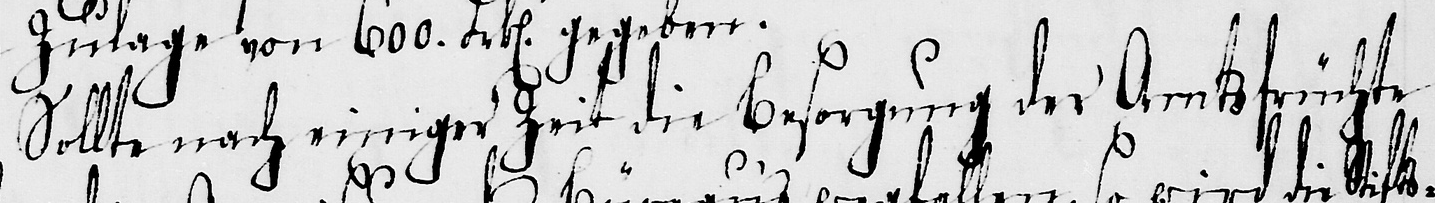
Sollte nach einiger Zeit die Besorgung der Amtsfrüchte
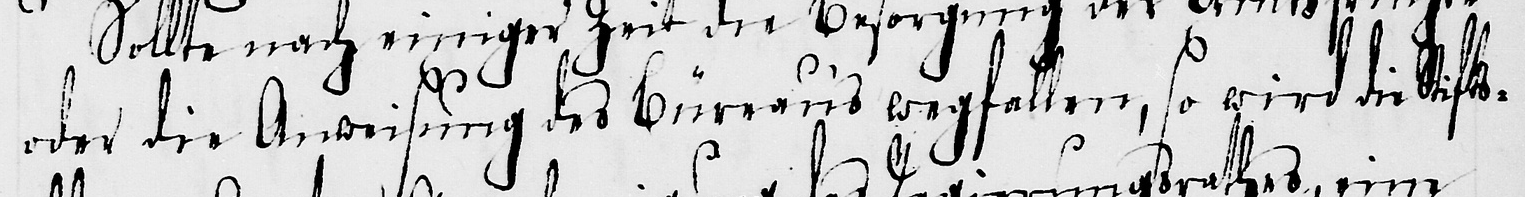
oder die Anweisung des Büreaus wegfallen, so wird die St¬
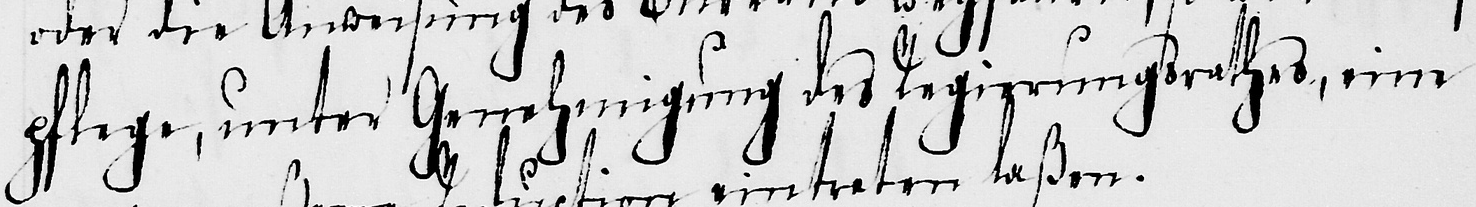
pflege, unter Genehmigung des Regierungsrathes, eine
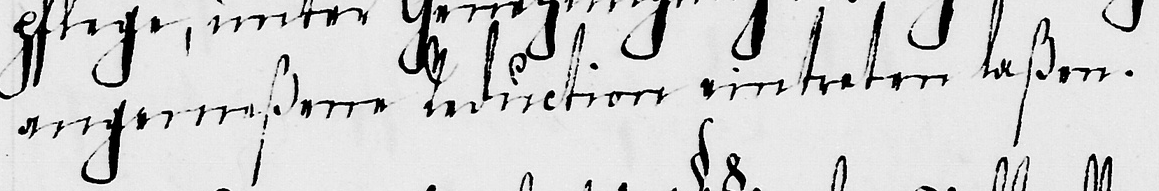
angemessene Reduction eintreten laßen.
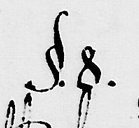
§. 8.
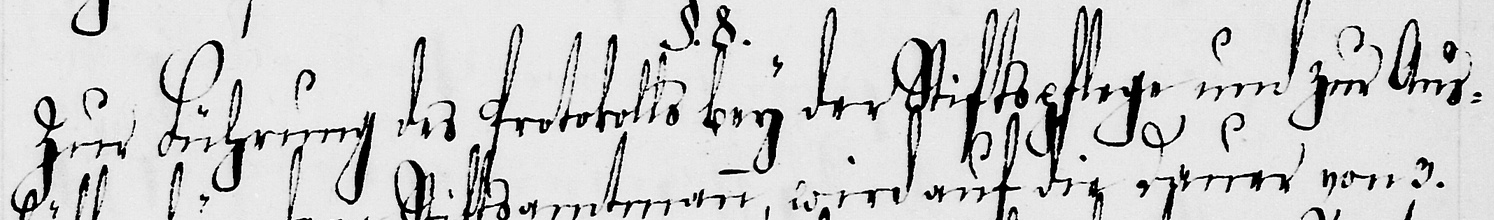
Zur Führung des Protokolls bey der Stiftspflege und zur Aus¬
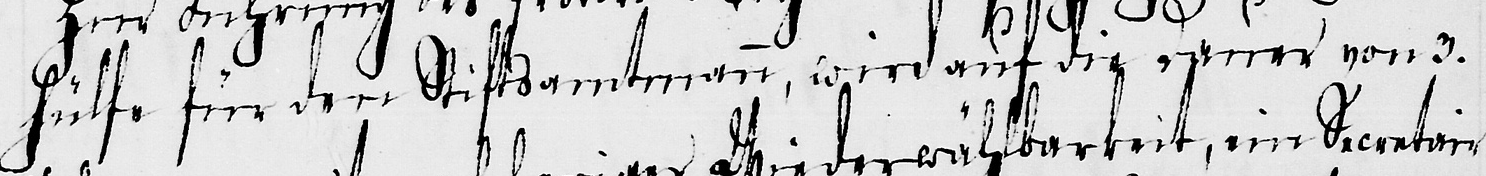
hülfe für den Stiftsamtmann, wird auf die Dauer von 3.
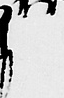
gewähl¬
